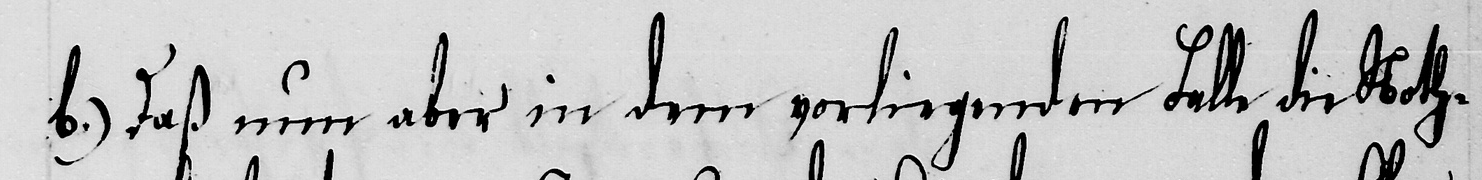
b.) Daß nun aber in dem vorliegenden Falle die Noth¬
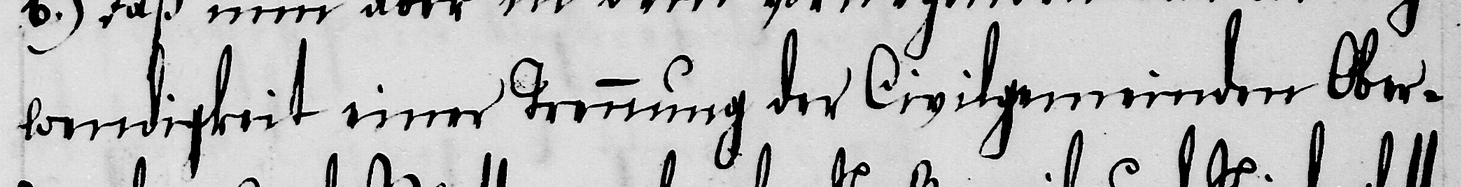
wendigkeit einer Trennung der Civilgemeinden Ober-
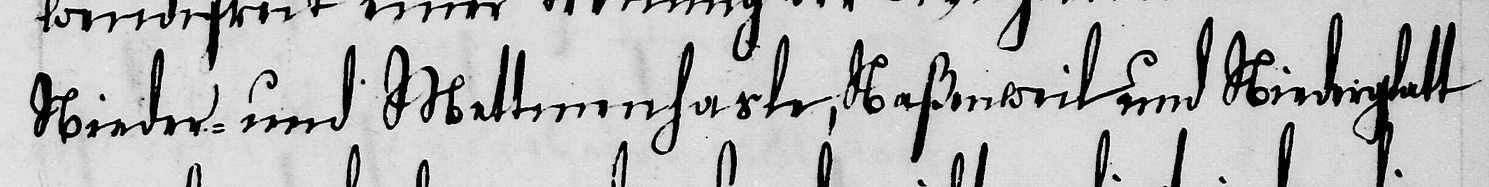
Nieder und Mettmenhasle, Naßenweil und Niederglatt
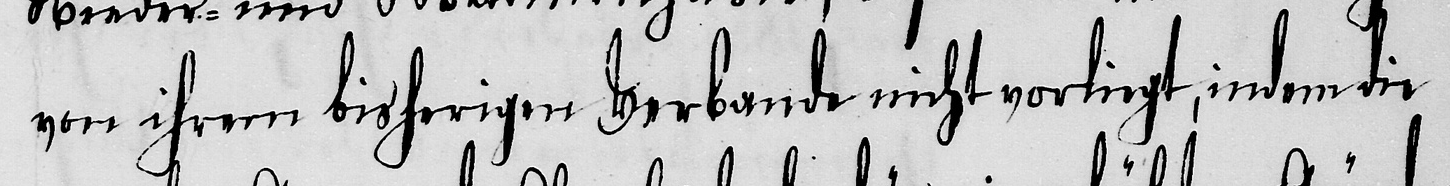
von ihrem bisherigen Verbande nicht vorliegt, indem die
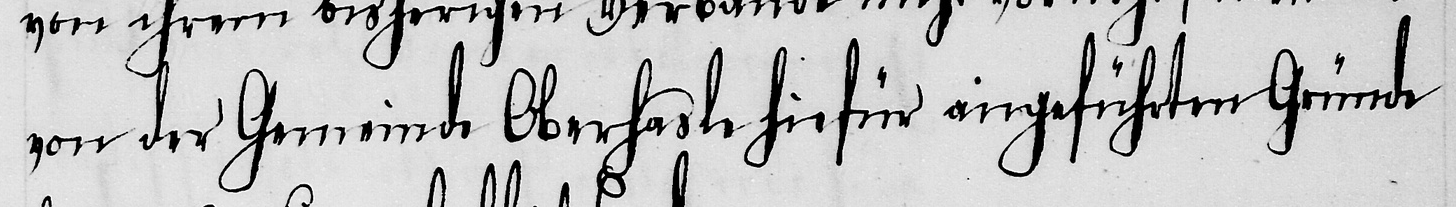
von der Gemeinde Oberhalse hiefür eingeführten Gründe
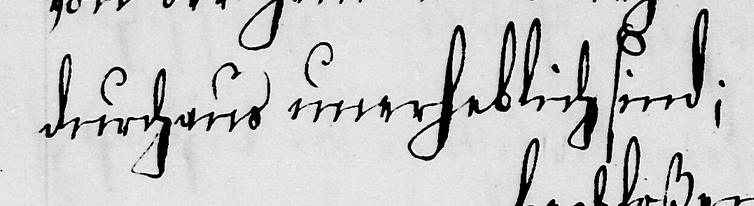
durchaus unerheblich sind:
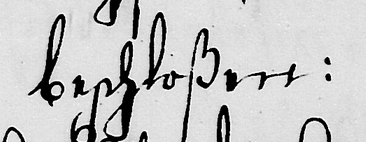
beschloßen:
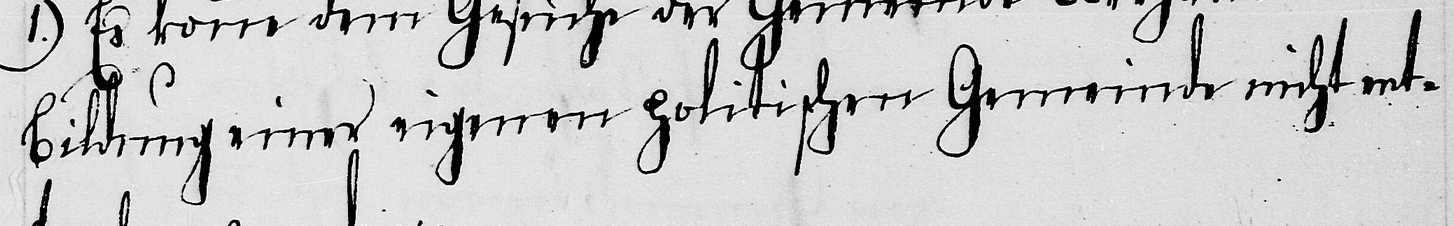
Bildung einer eigenen politischen Gemeinde nicht ent¬
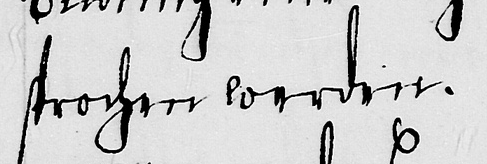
sprochen werden.
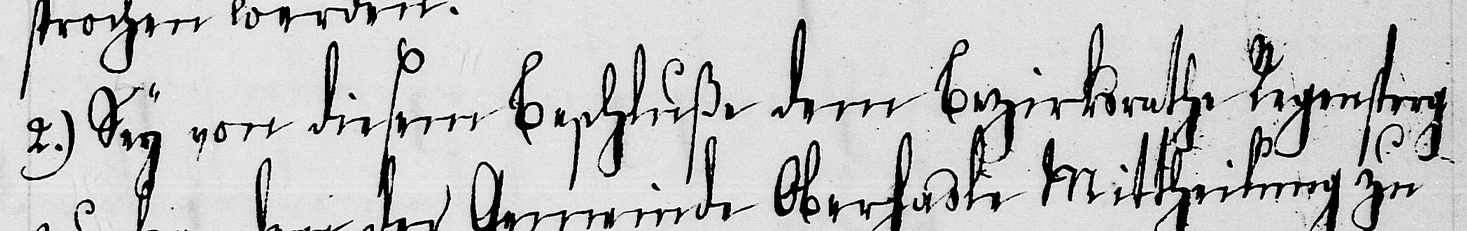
2.) Sey von diesem Beschluße dem Bezirksrathe Regensperg
